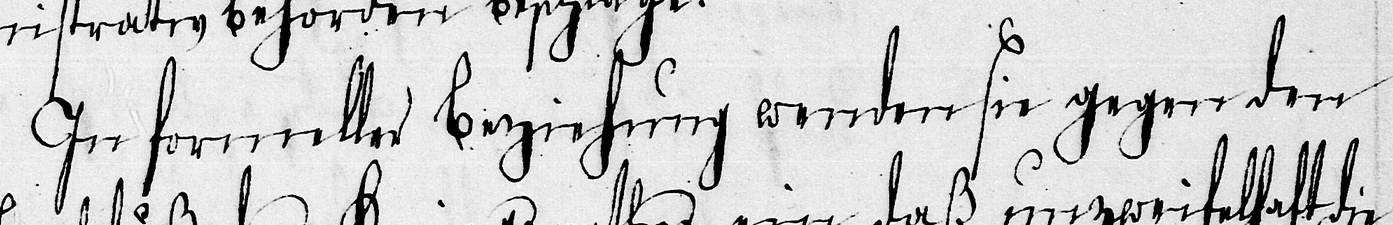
In formeller Beziehung wenden sie gegen den
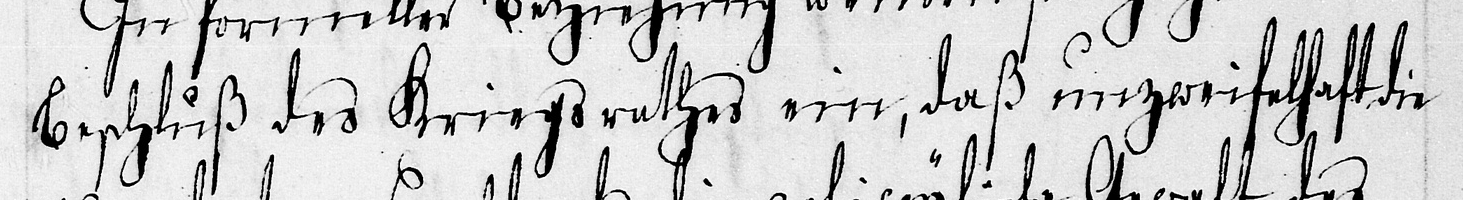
Beschluß des Kriegsrathes ein, daß unzweifelhaft die
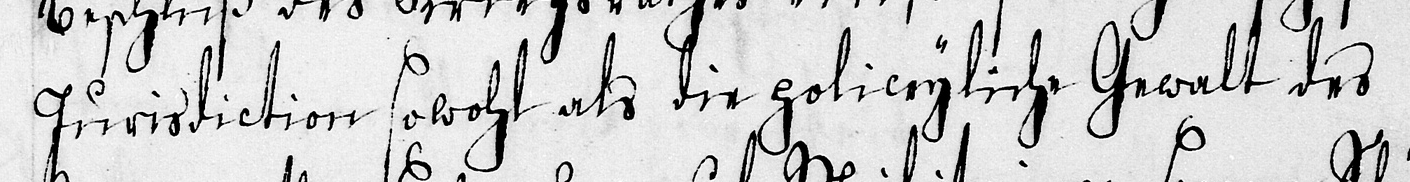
Jurisdiction sowohl als die policeyliche Gewalt des
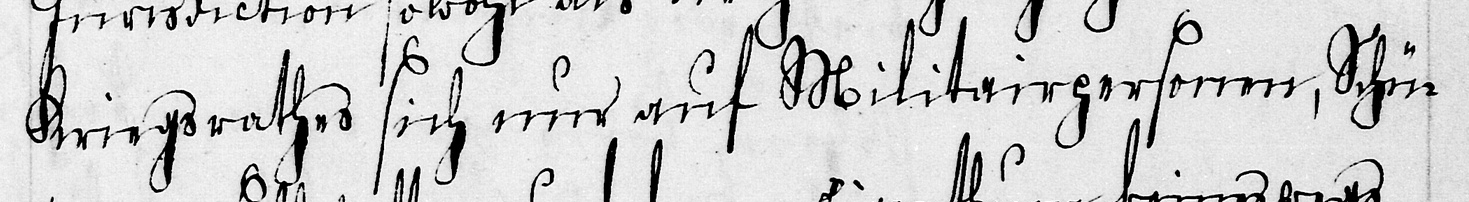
Kriegsrathes sich nur auf Militairpersonen, Schü¬
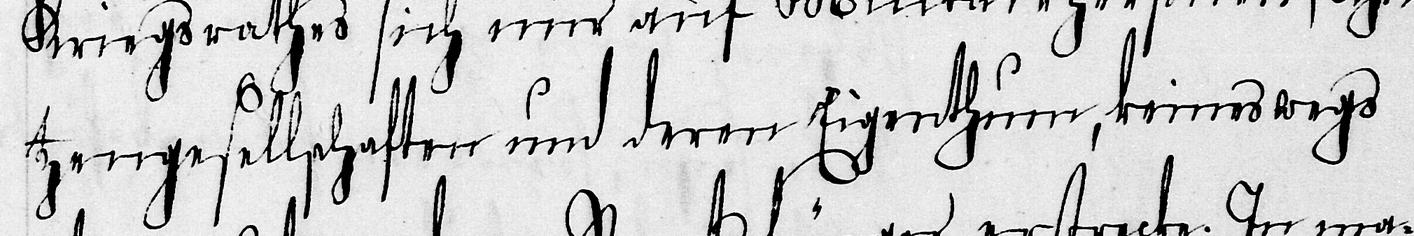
tzengesellschaften und deren Eigenthum, keineswegs
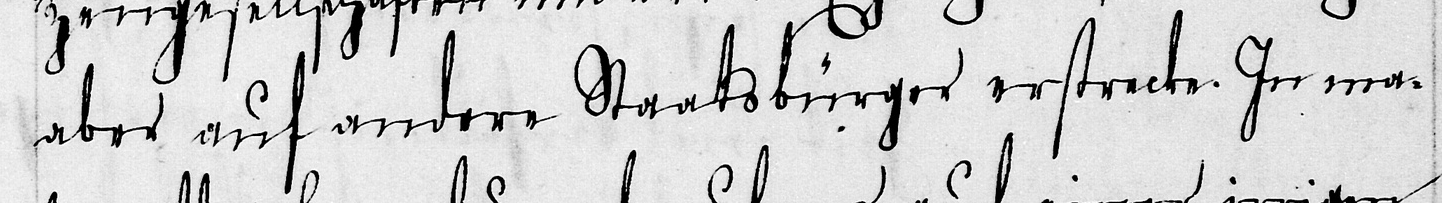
aber auf andere Staatsbürger erstrecke. In ma¬
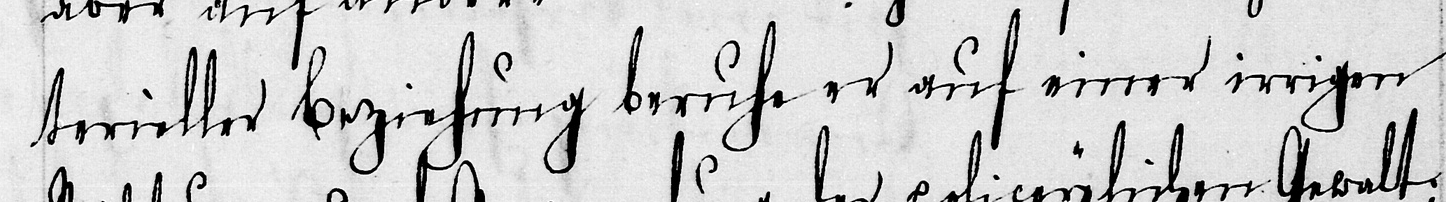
terieller Beziehung beruhe er auf einer irrigen
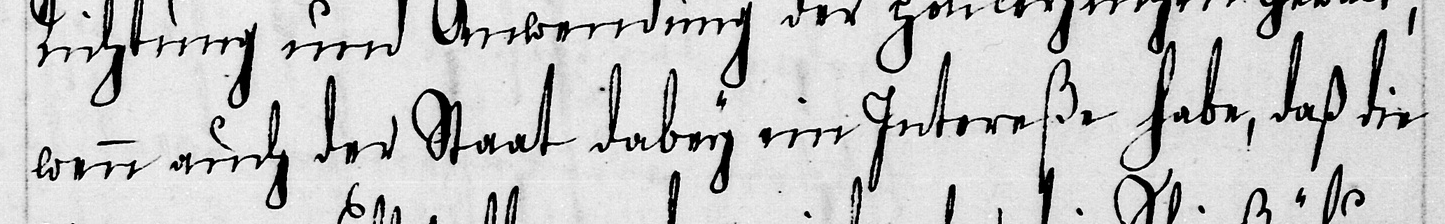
wenn auch der Staat dabey ein Intereße habe, daß die
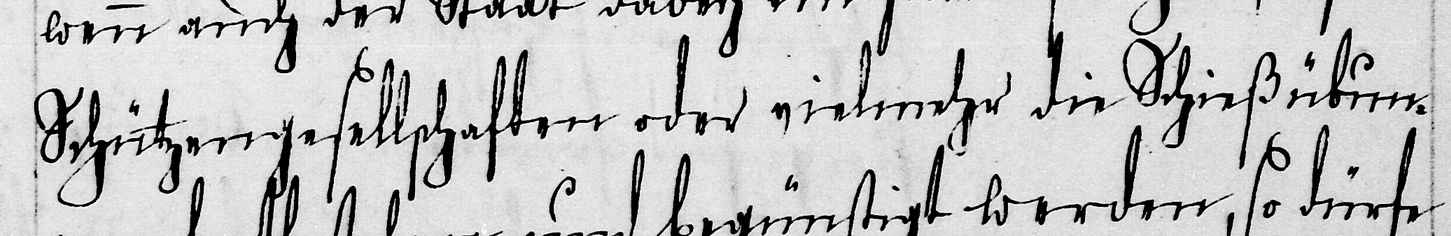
Schützengesellschaften oder vielmehr die Schießübun¬
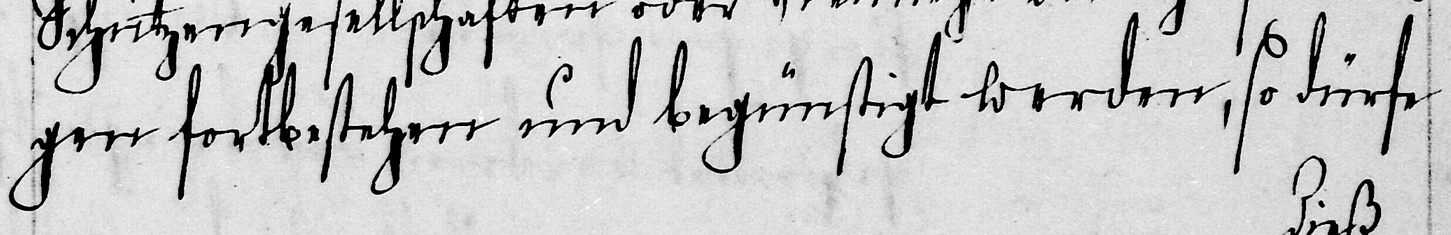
gen fortbestehen und begünstigt werden, so dürfe
